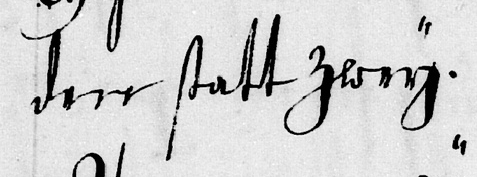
den statt zwey.
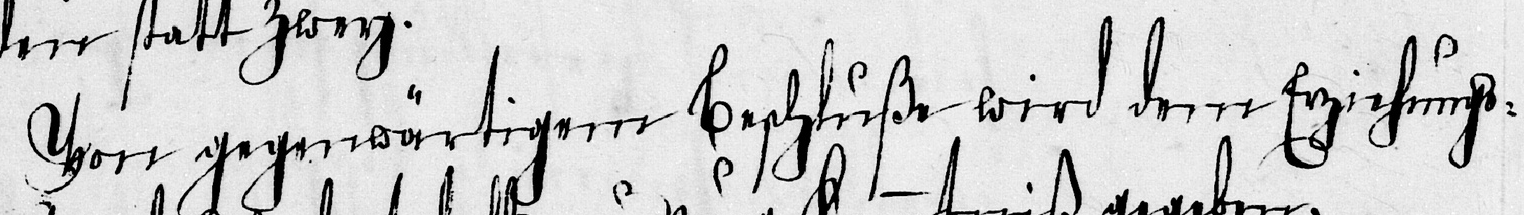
Von gegenwärtigem Beschluß wird dem Erziehungs¬
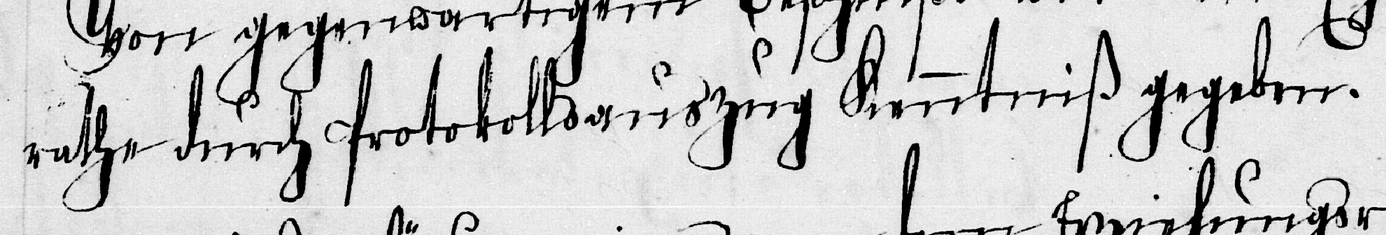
rathe durch Protokollsauszug Kenntniß gegeben.
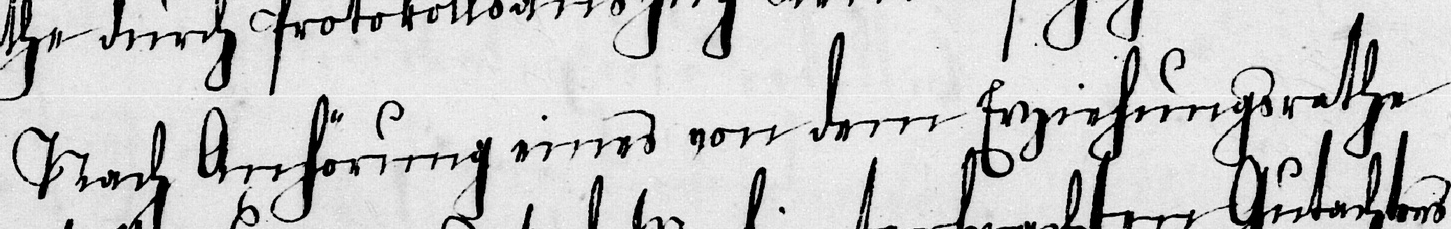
Nach Anhörung eines von dem Erziehungsrathe
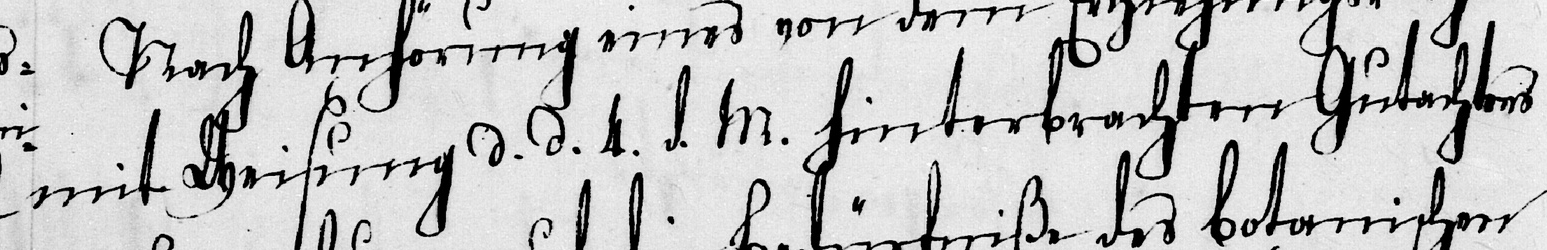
mit Weisung d. d. 4. d. M. hinterbrachten Gutachtens
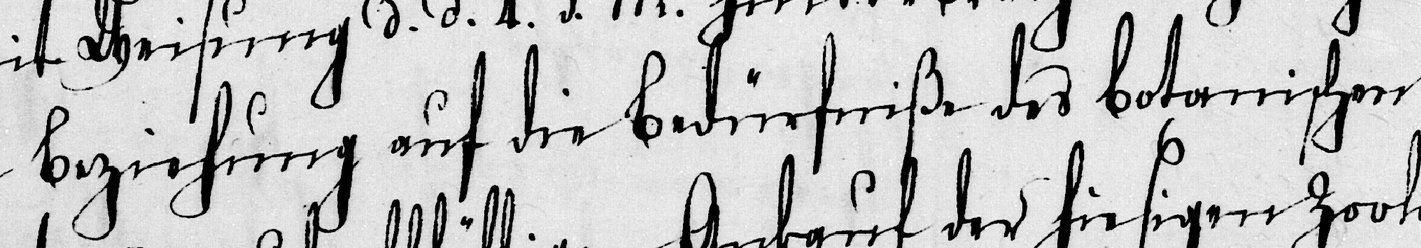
Beziehung auf die Bedürfniße des botanischen
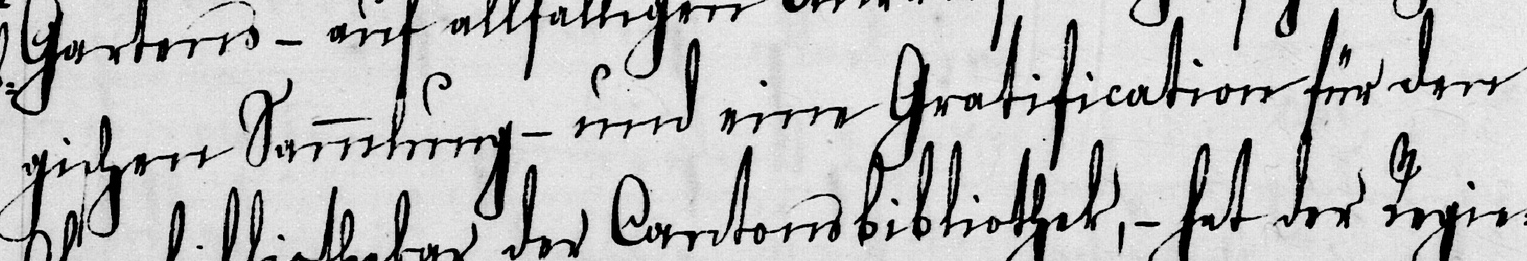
gischen Sammlung – und eine Gratification für den
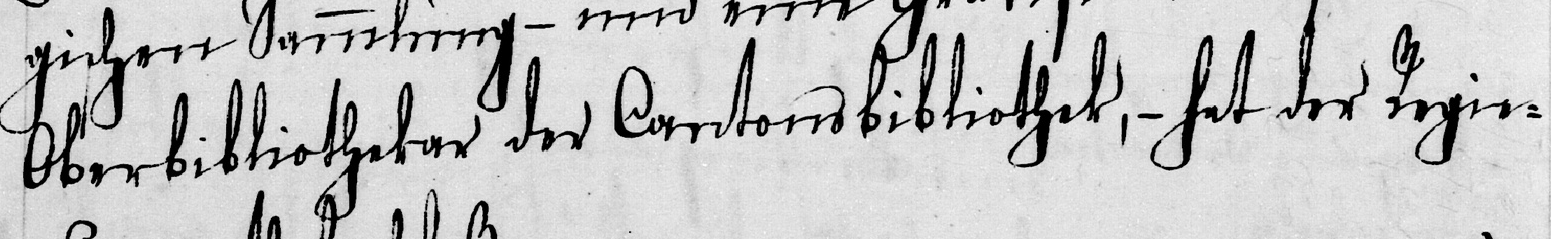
Oberbibliothekar der Cantonsbibliothek, – hat der Regie¬
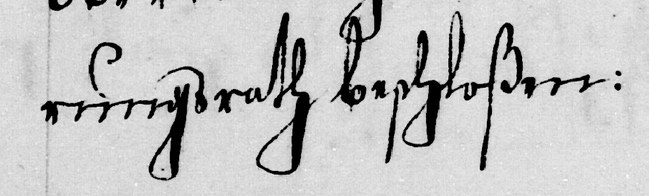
rungsrath beschloßen:
